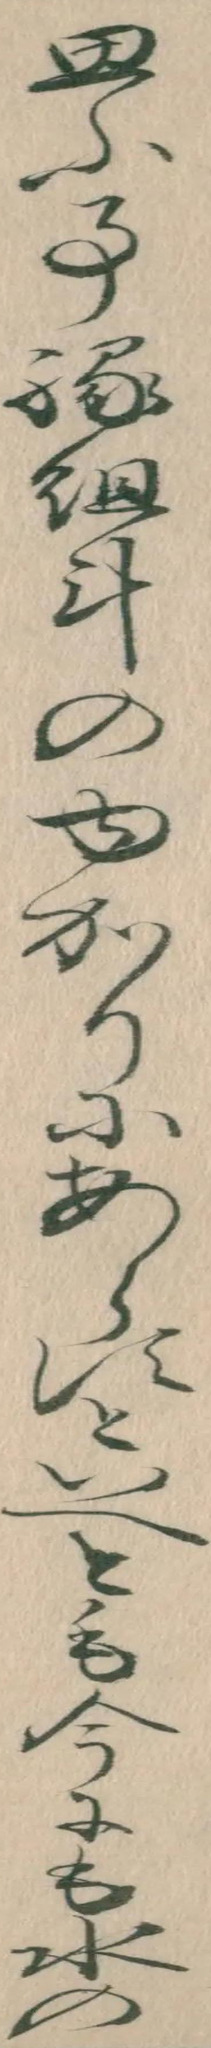思ふ事縁組計のゆかりにあらすといへとも今にも水の
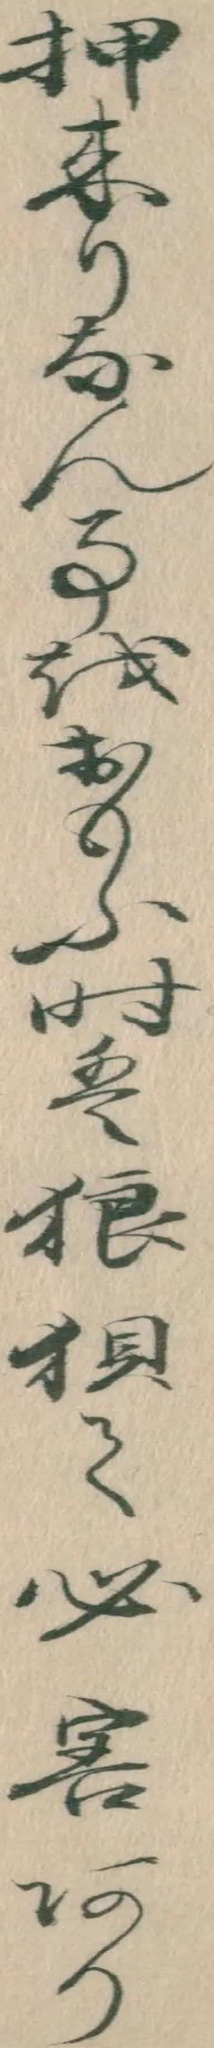押来りなん事をおもふ時は狼狽て必害あり
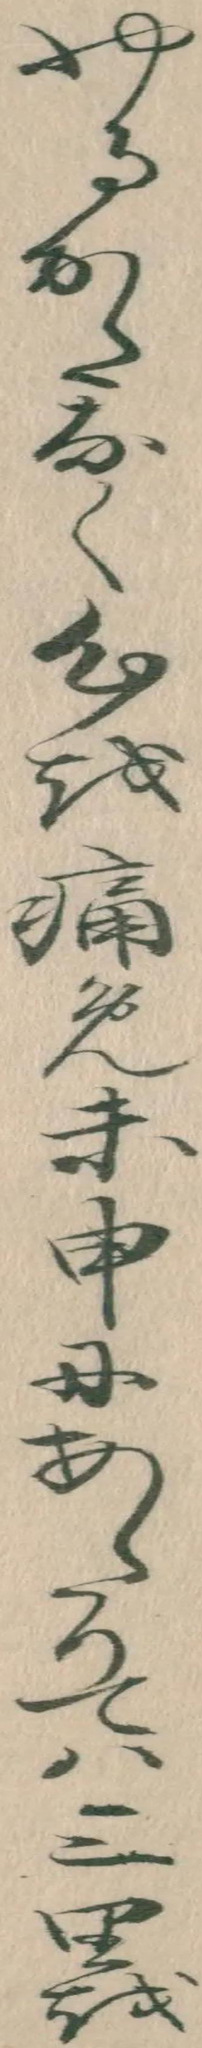やるかたなく心を痛め未申にあたりては三里を
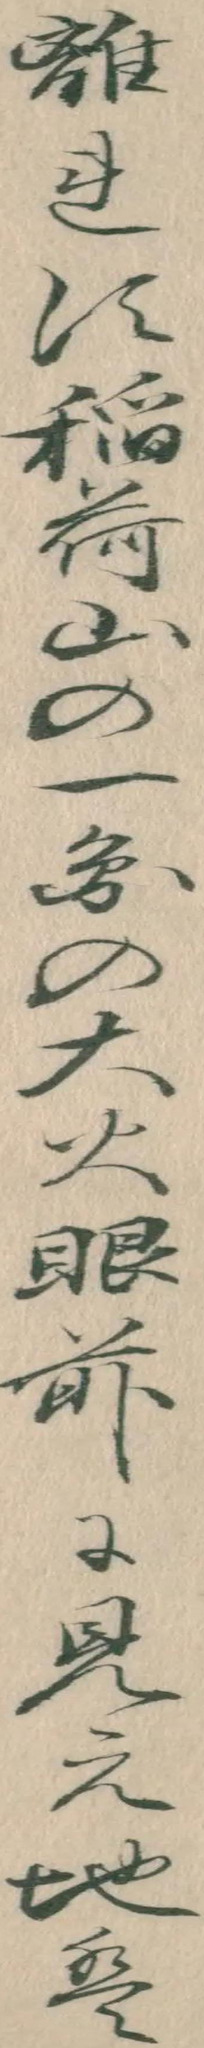離れす稲荷山の一円の大火眼前に見え地は
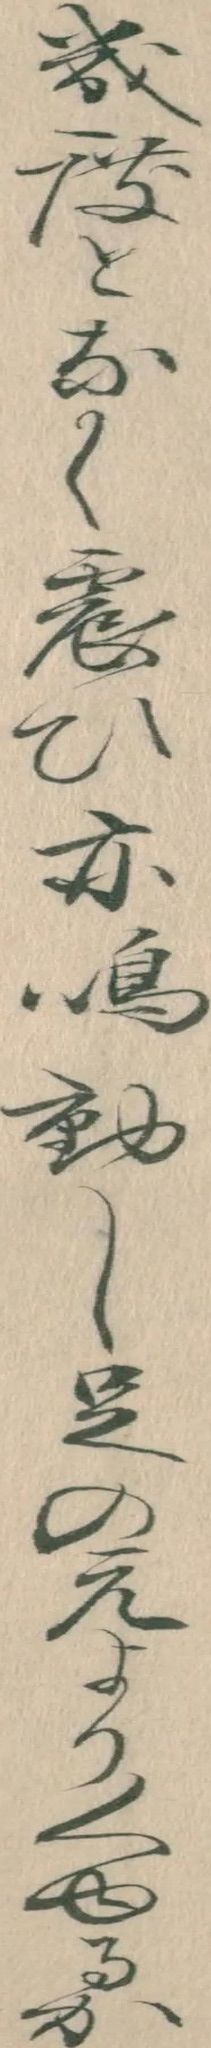幾度となく震ひ亦鳴動し足の元よりくゆるか
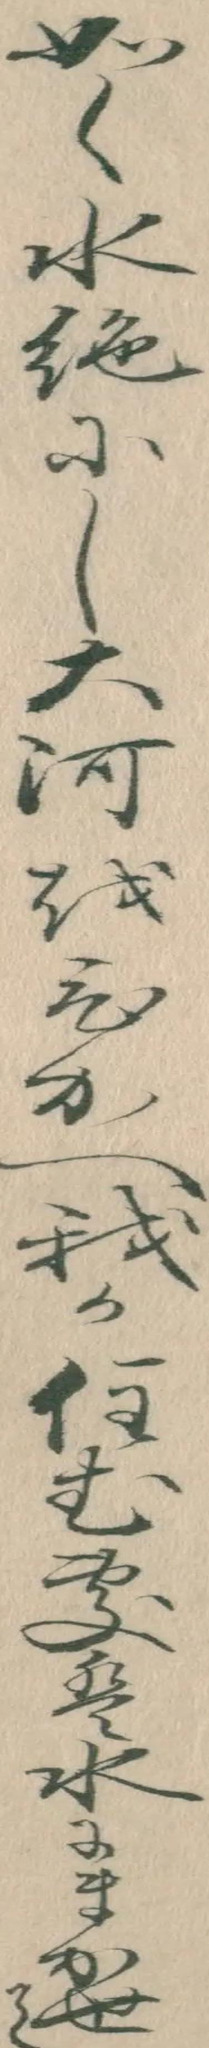如く水絶にし大河をひかへ我か住む処は水にまかせて
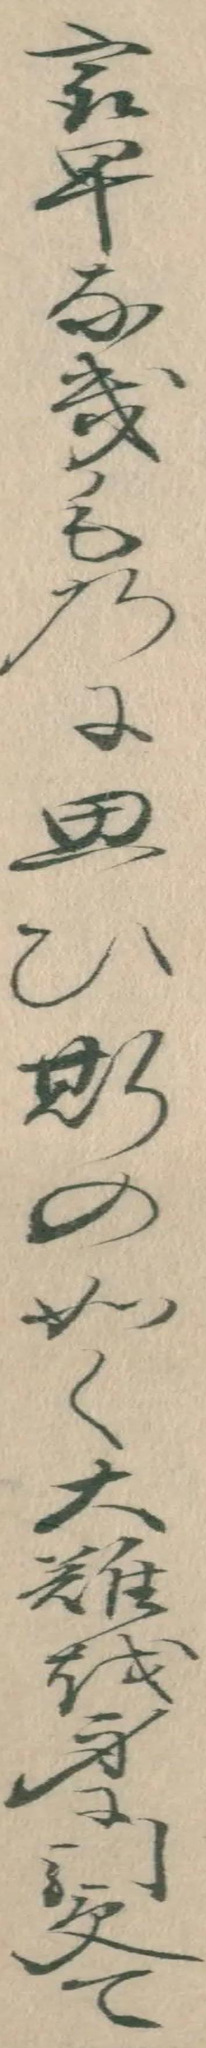最早なきものに思ひ斯の如く大難を身に引受て

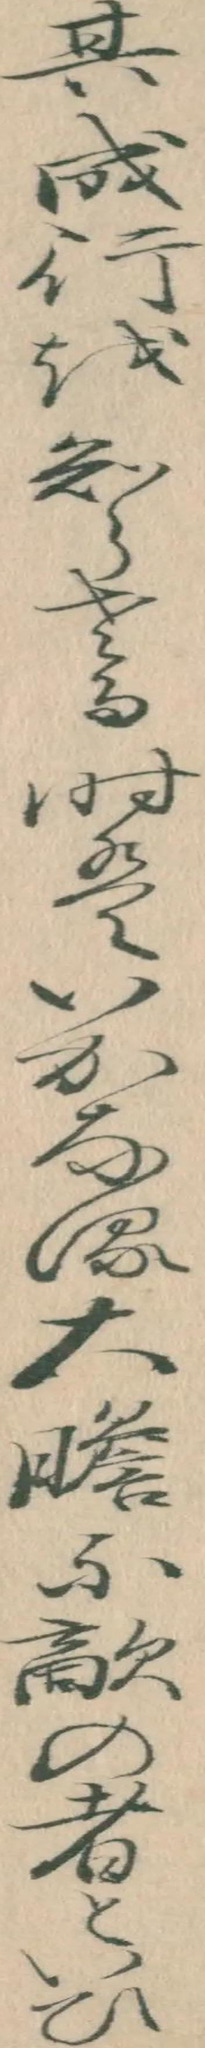其成行を知らさる時はいかなる大胆不敵の者といひ
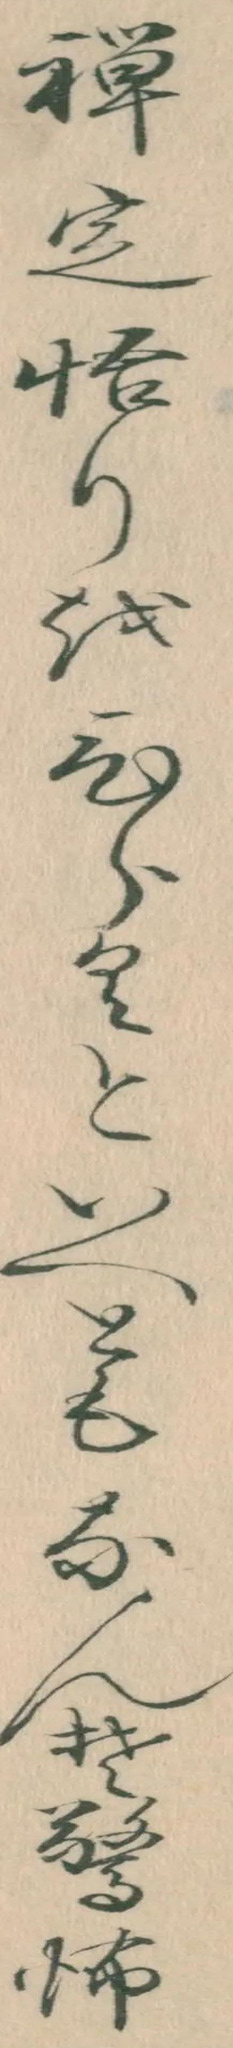禅定悟りをひらくといへともなんそ驚怖
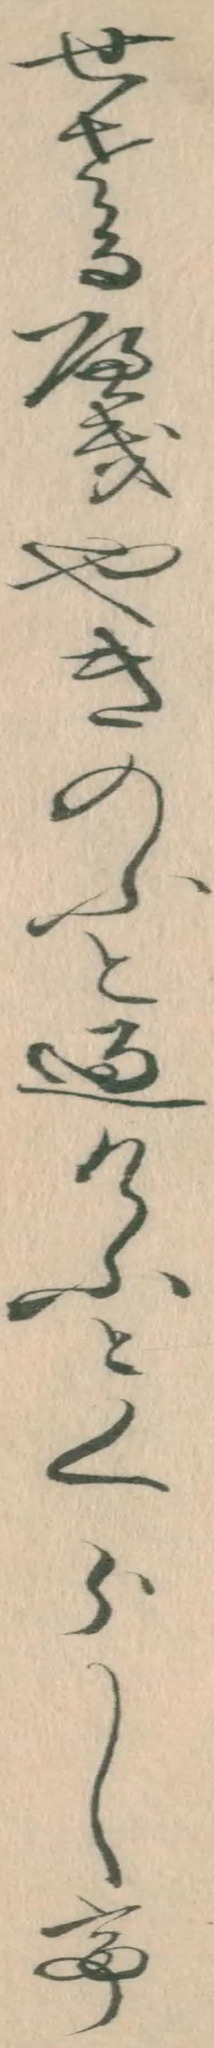せさるへきやきのふと過けふとくらして
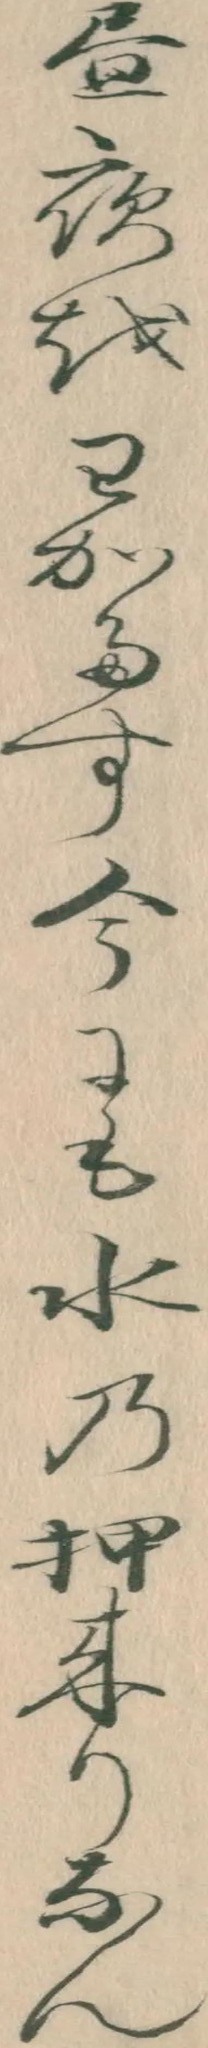昼夜をわかたす今にも水の押来りなん
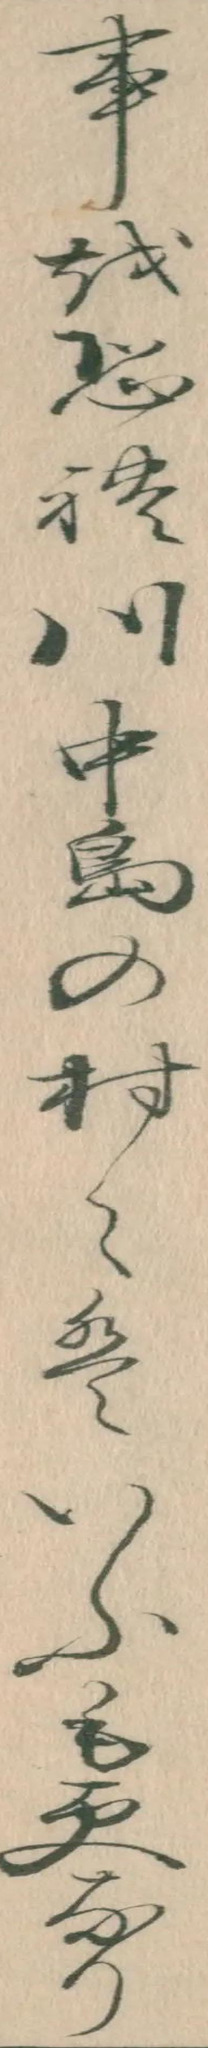事を恐れ川中島の村〻はいふも更なり
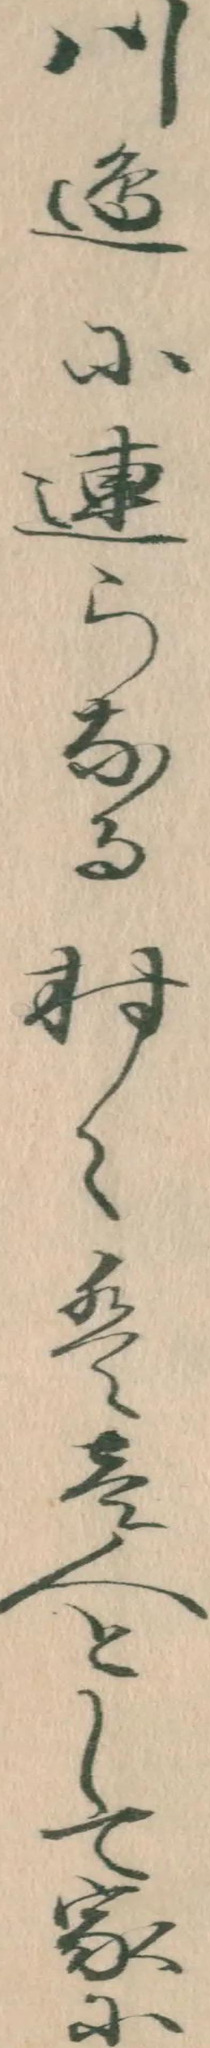川辺に連らなる村〻は壱人として家に
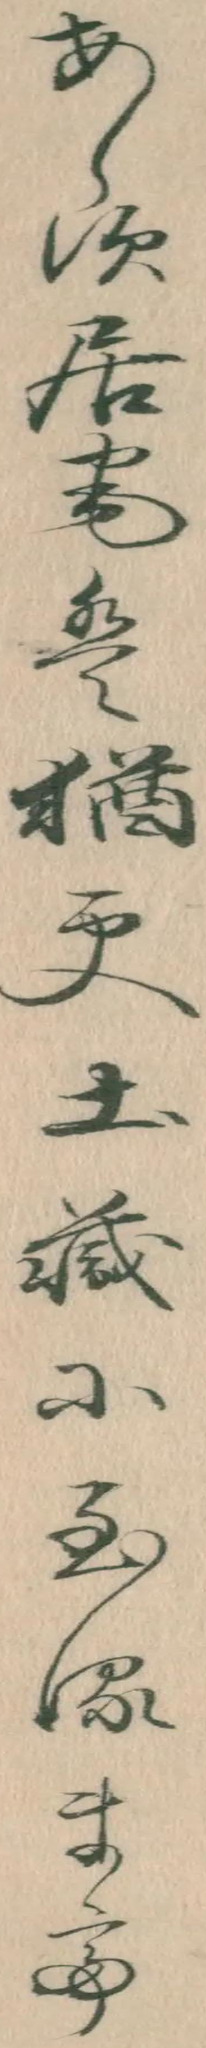あらす居宅は猶更土蔵に至るまて
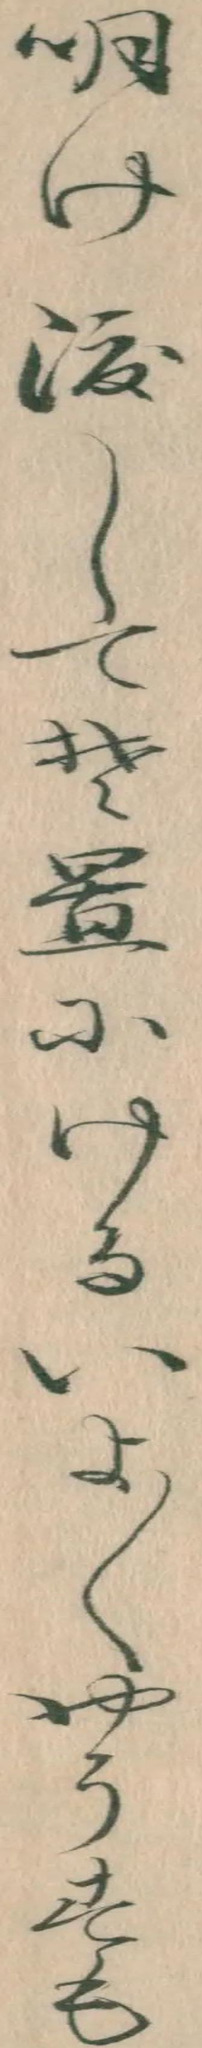明け渡してそ置にけるいよ〳〵やうすも
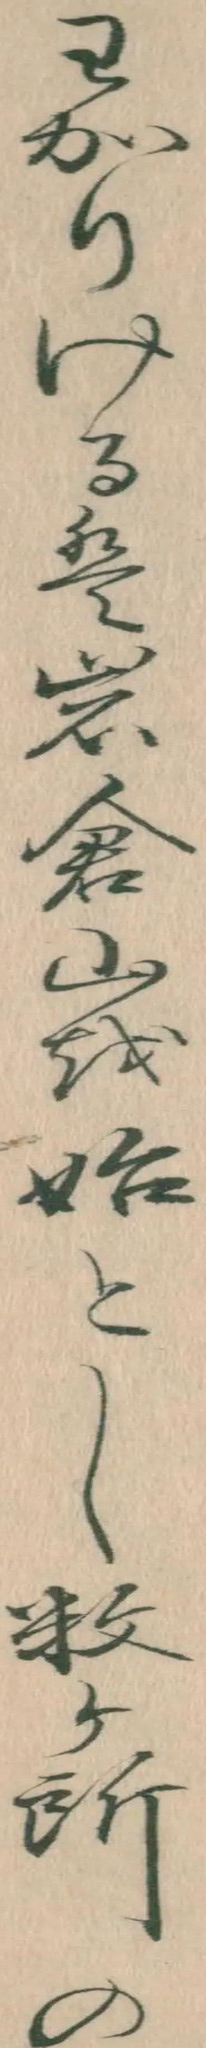わかりけるは岩倉山を始とし数ヶ所の
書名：俗語之種. [6]
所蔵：国立国会図書館 National Diet Library, JAPAN
